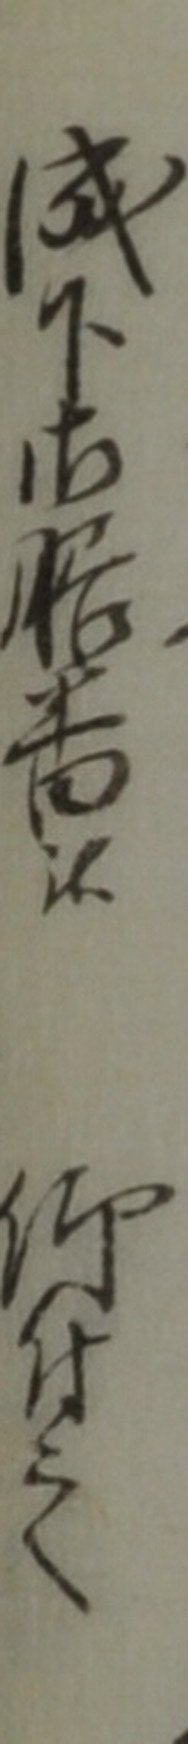成下御膳番被仰付之
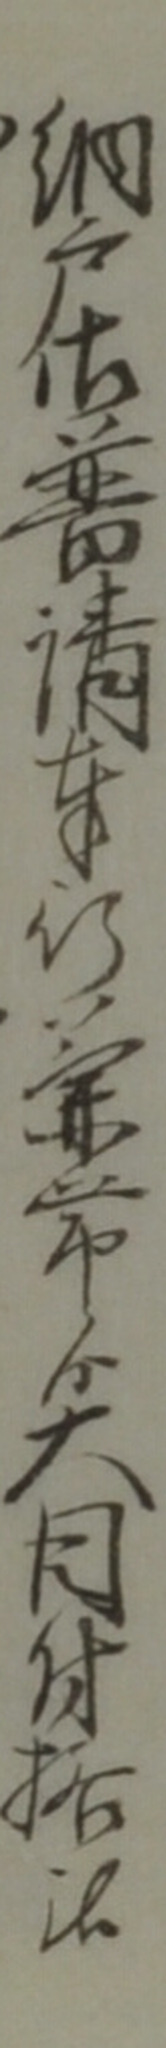納戸御普請奉行兼帯ゟ大目付格被
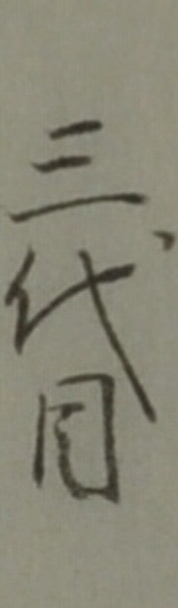三代目
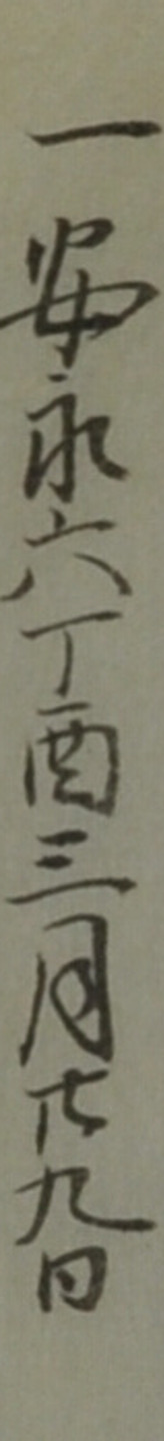一安永六丁酉三月廿九日
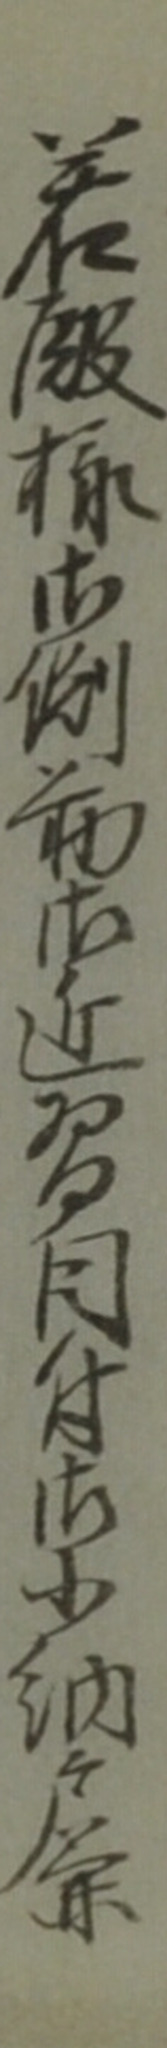若殿様御側勤御近習目付御小納戸は兼
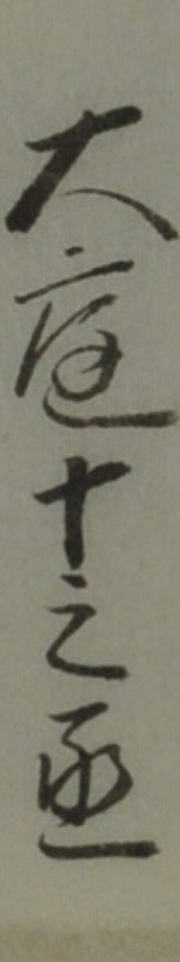大庭十之丞
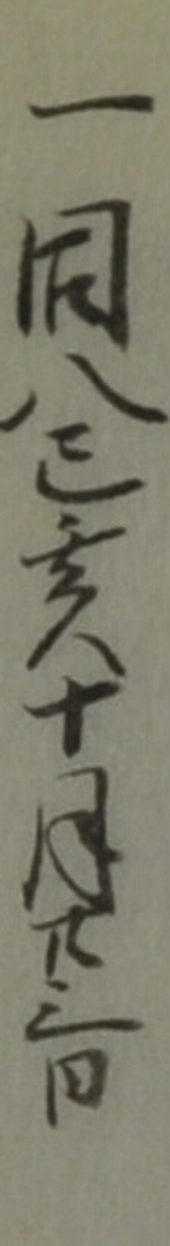一同八己亥十月廿三日
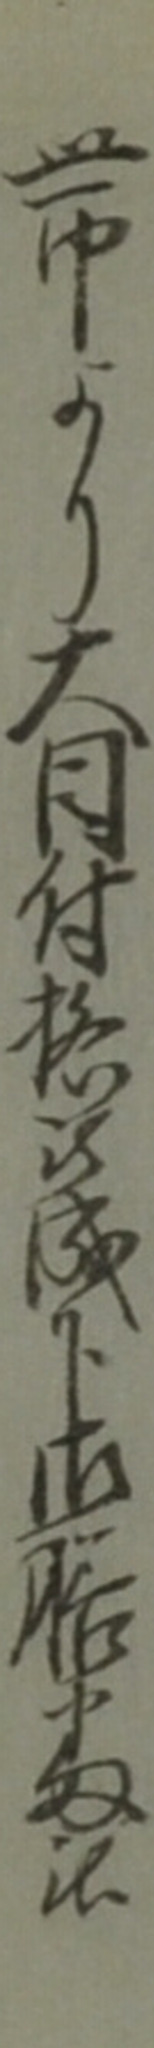帯より大目付格被成下御膳番被
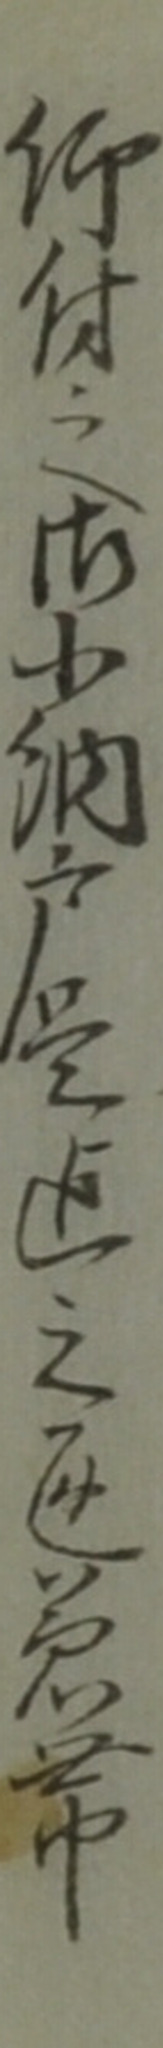仰付之御小納戸是迄之通兼
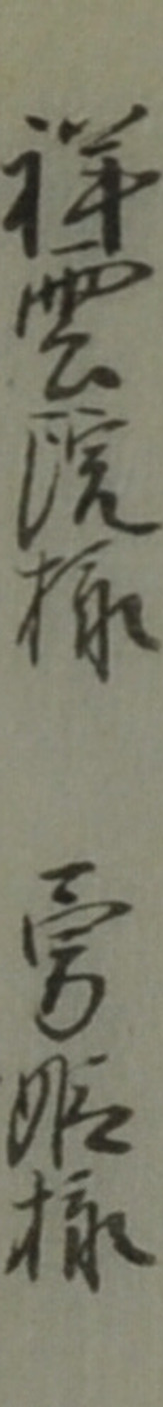祥雲院様勇姫様
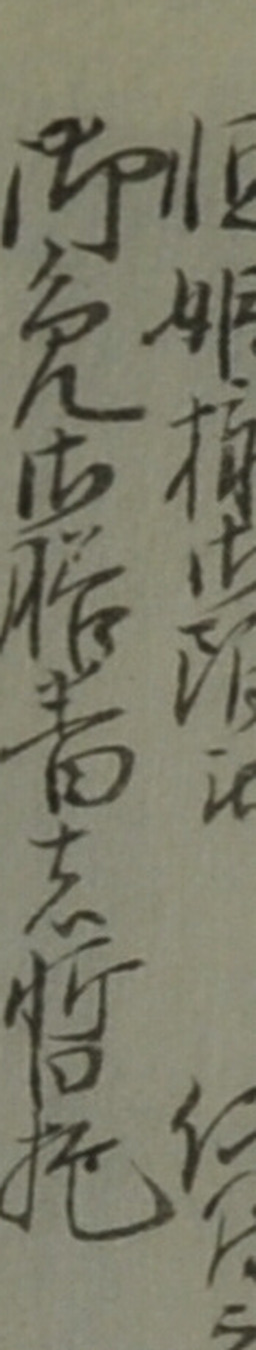御免御膳番者暫抱
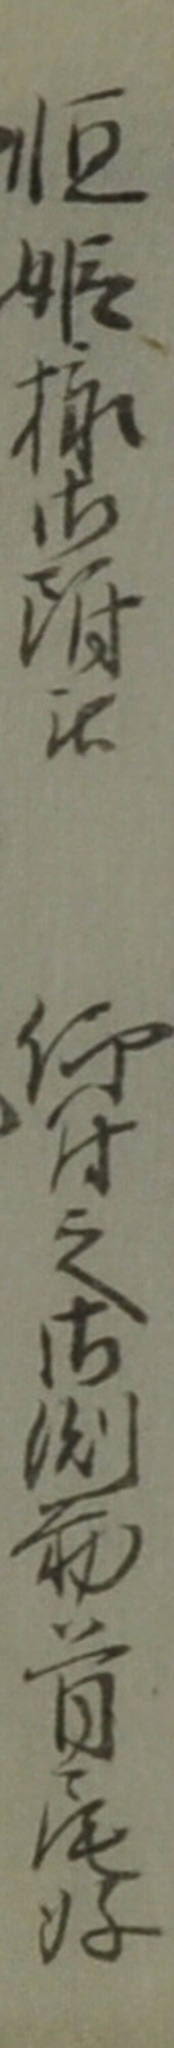恒姫様御附被仰付之御側勤首尾好
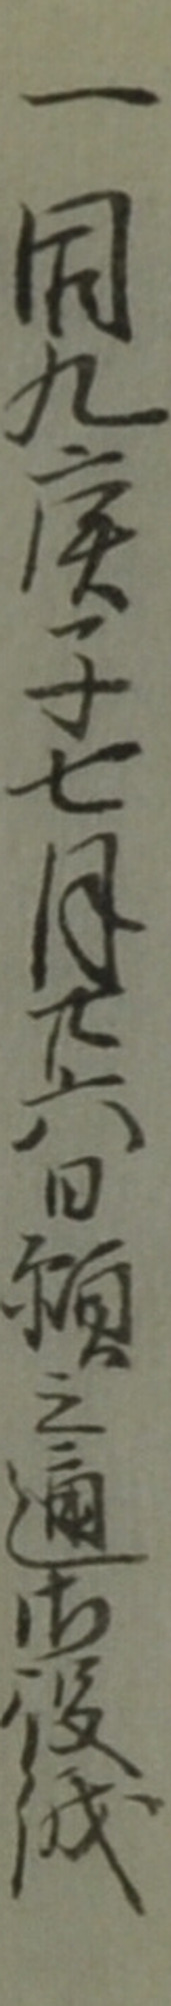一同九庚子七月廿六日願之通御役儀
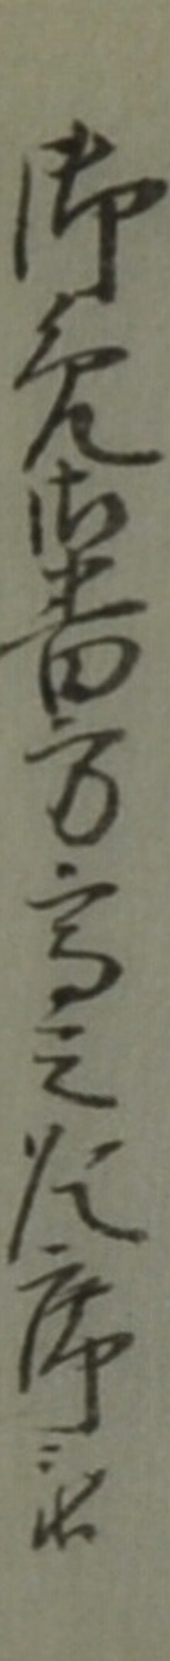御免御番方高之順席被
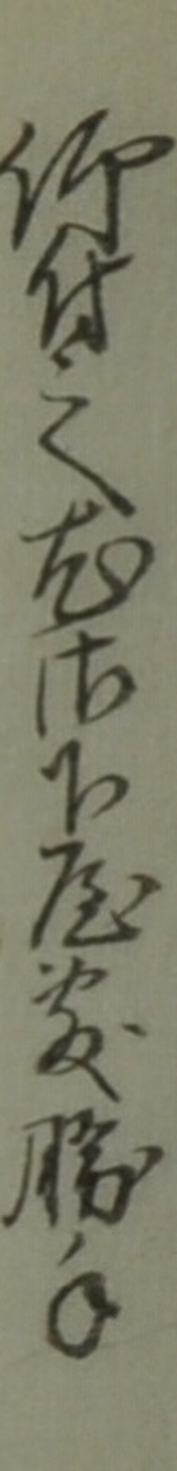仰付之尤御下屋敷勝手

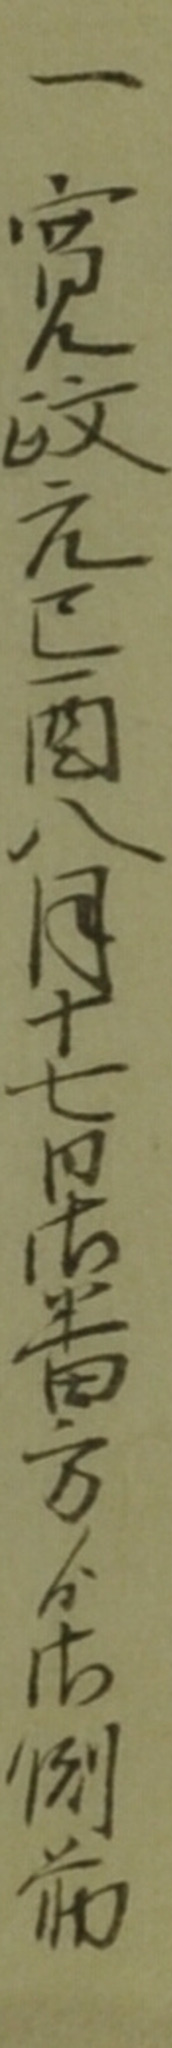一寛政元巳酉八月十七日御番方ゟ御側勤
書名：諸御役代々録（四）
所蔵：伊那市立高遠町図書館・合同会社AMANE
